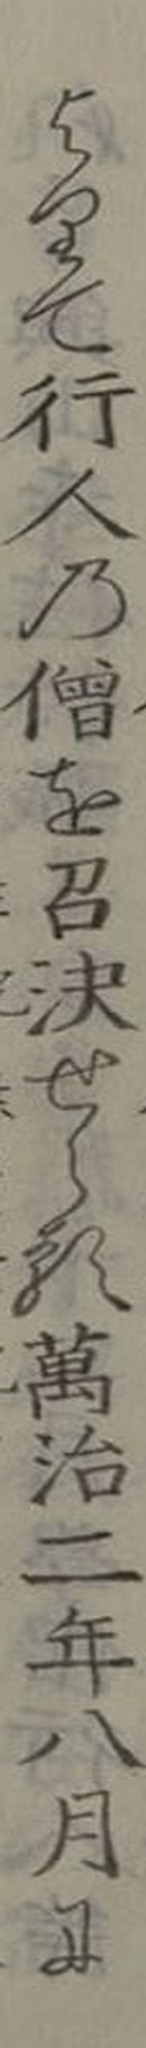よりて行人の僧を召決せらる萬治二年八月に
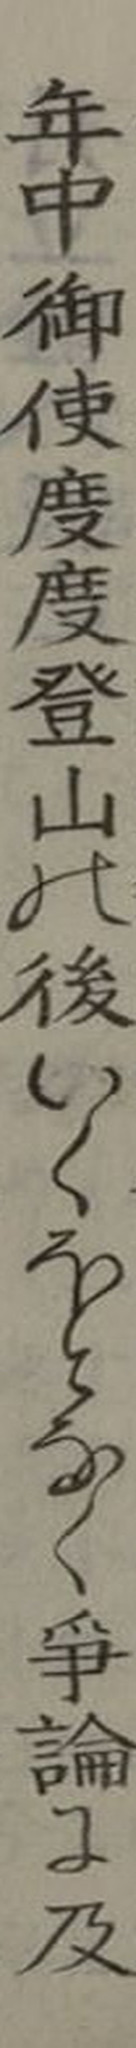年中御使度度登山の後いくほとなく爭論に及
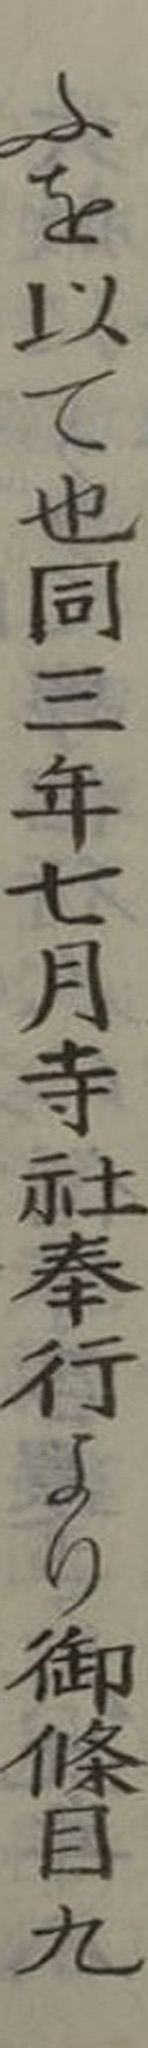ふを以て也同三年七月寺社奉行より御條目九
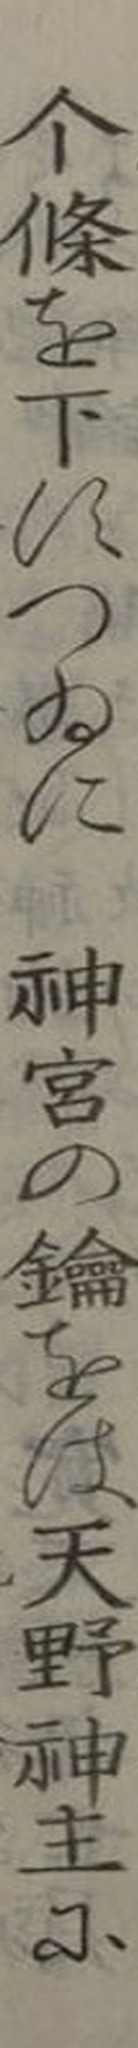个條を下すつゐに神宮の鑰をは天野神主に

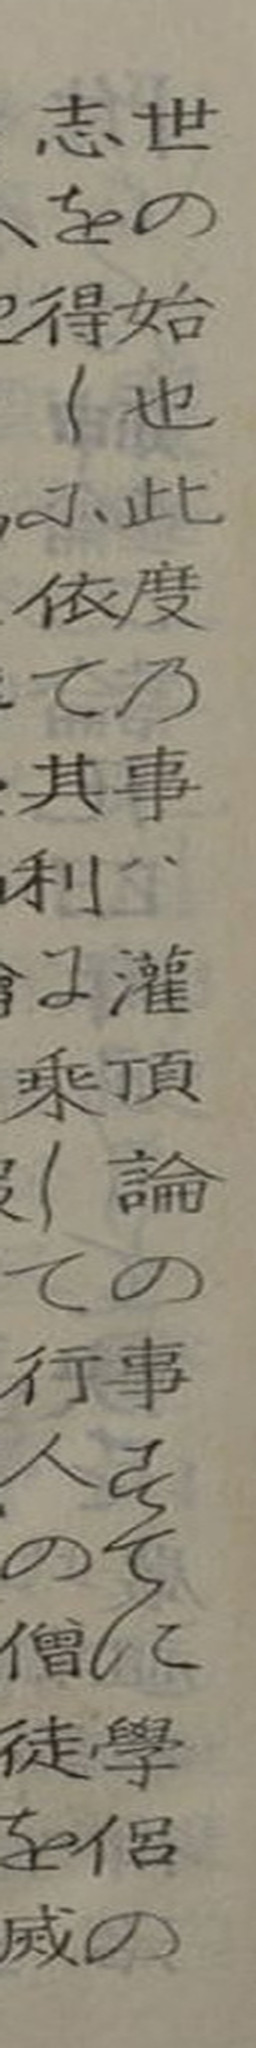志を得しに依て其利に乘して行人の僧徒を滅
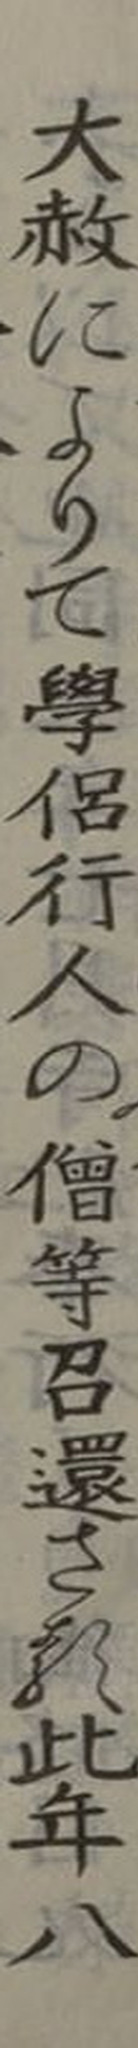大赦によりて學侶行人の僧等召還さる此年八
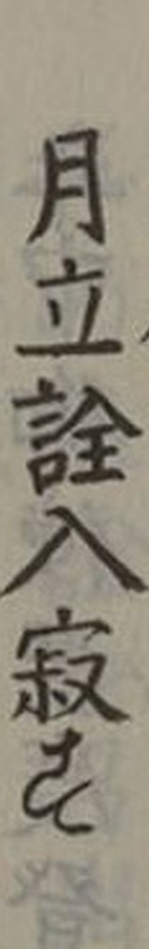月立詮入寂を
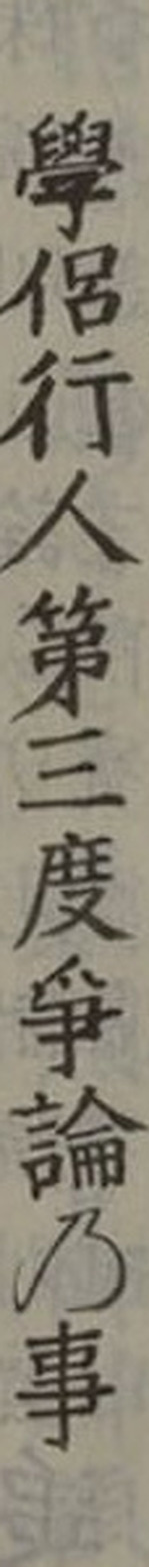學侶行人第三度爭論の事
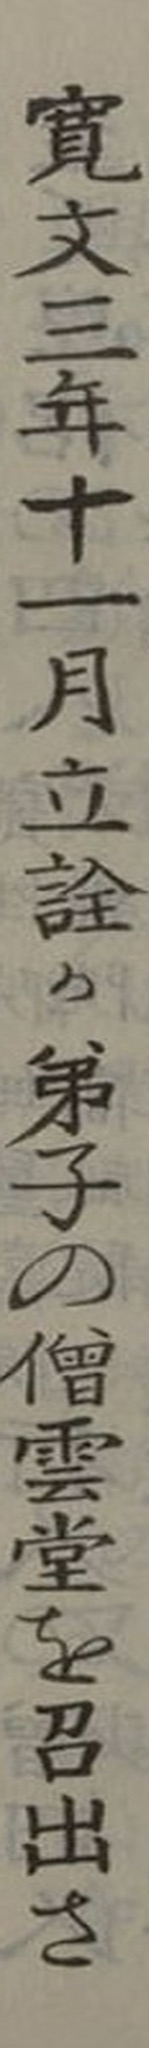寛文三年十一月立詮か弟子の僧雲堂を召出さ
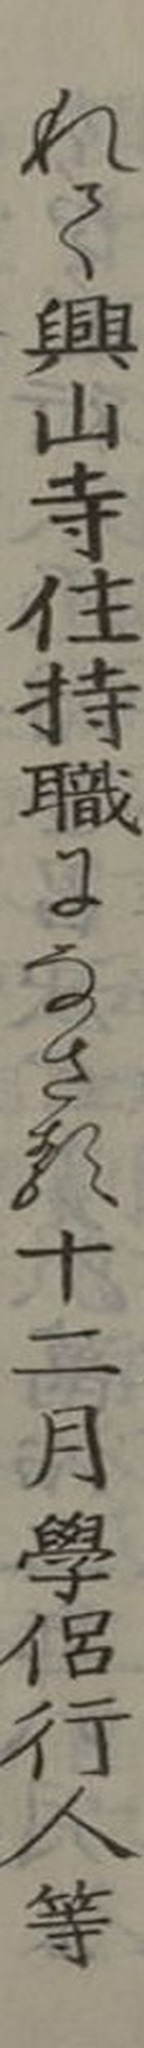れて興山寺住持職になさる十二月學侶行人等
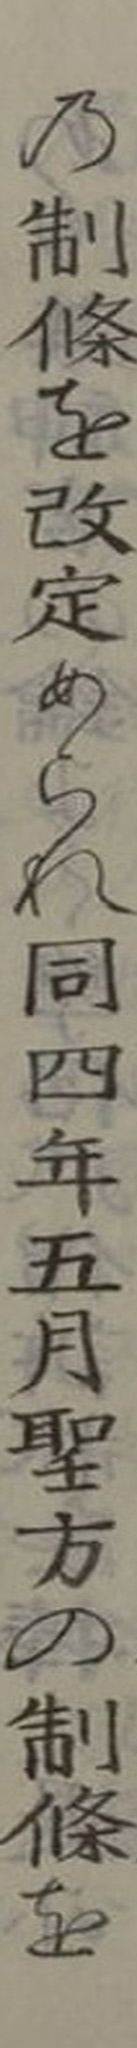の制條を改定められ同四年五月聖方の制條を
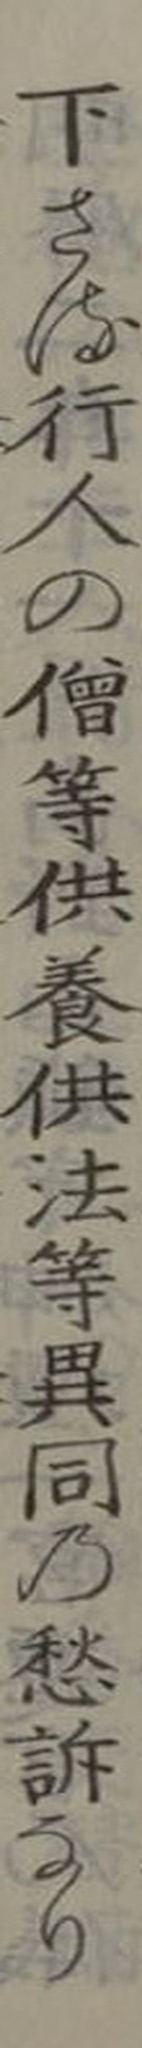下さる行人の僧等供養供法等異同の愁訴なり
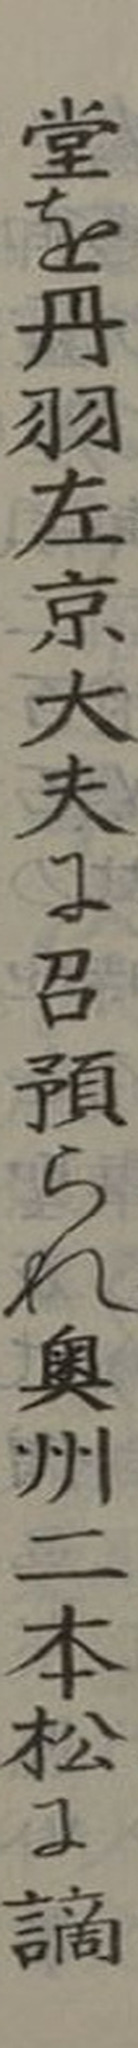堂を丹羽左京大夫に召預られ奥州二本松に謫
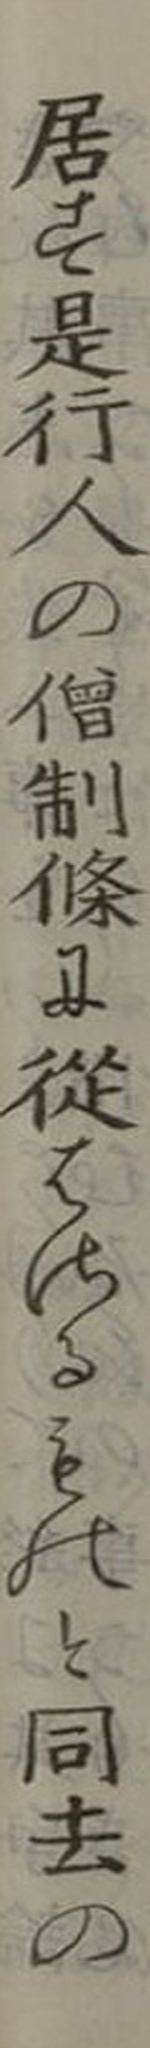居す是行人の僧制條に従はるるものと同去の
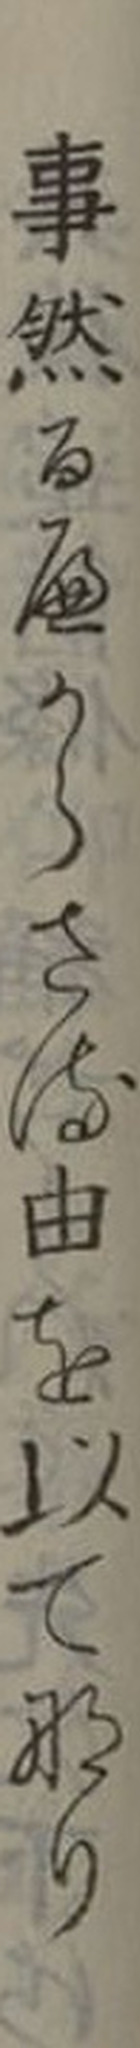事然るへからさる由を以てなり
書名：骨董録
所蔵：University of the Ryukyus Library
